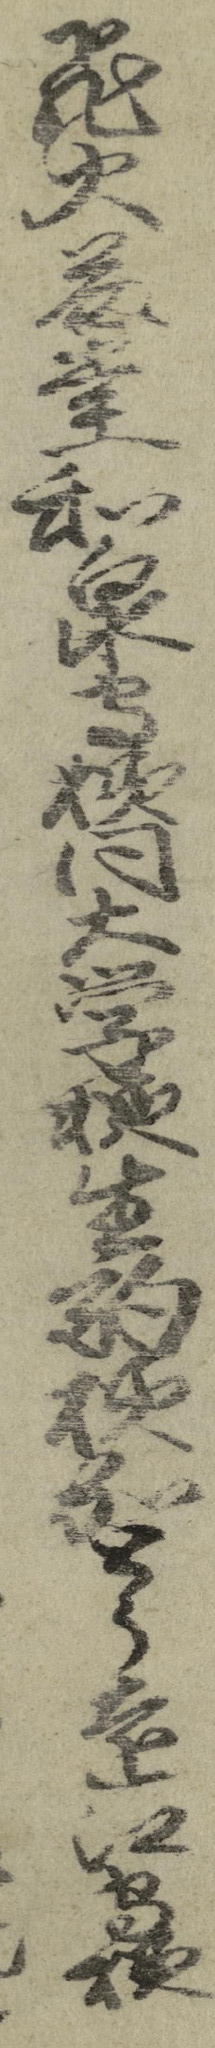飛火藤堂和泉守様同大学様生駒様加とう遠江守様
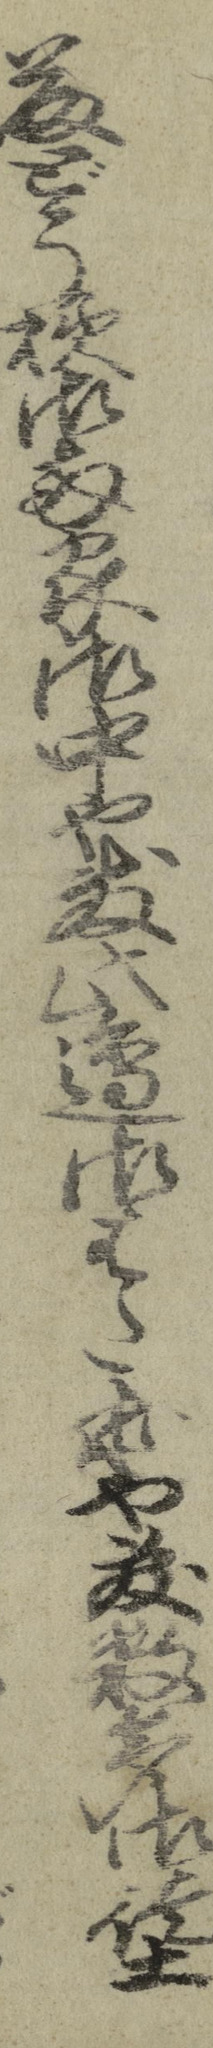藤どう様御両家御中や敷此辺御はた本や敷数多御徒士
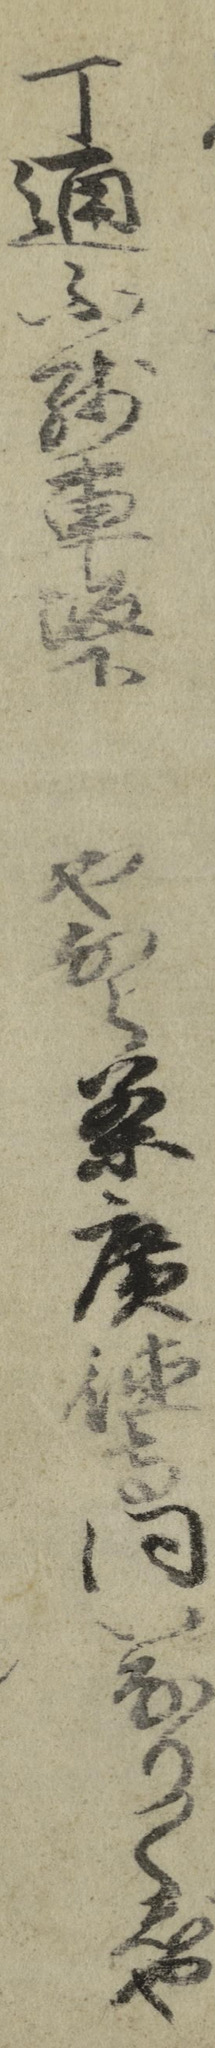丁通不残車坂下やなら茶広徳寺同いなりくじや
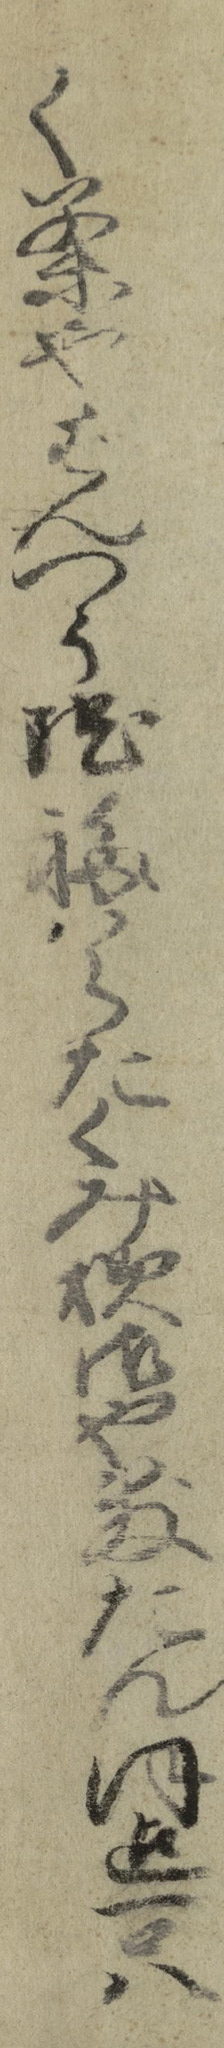く茶やばんつう院福はらたくみ様御や敷たんほ迄一口は
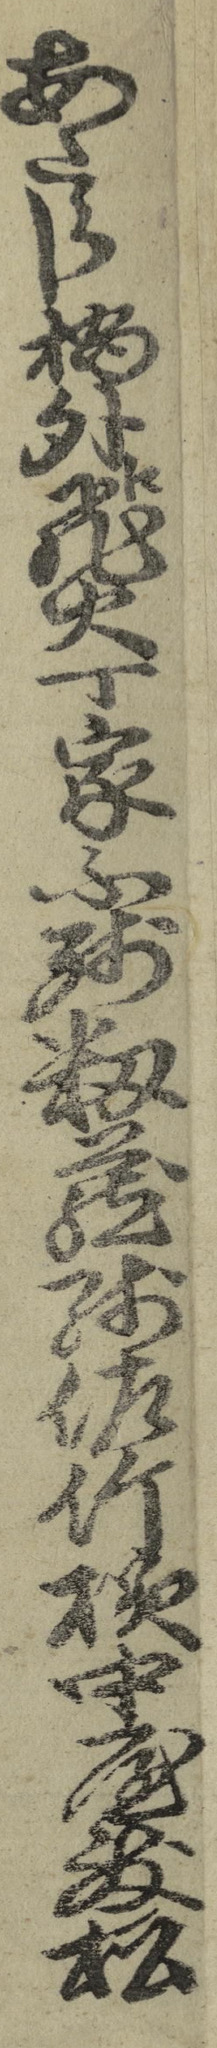あたらし橋外え飛火丁家不残籾蔵残佐竹様中屋敷松
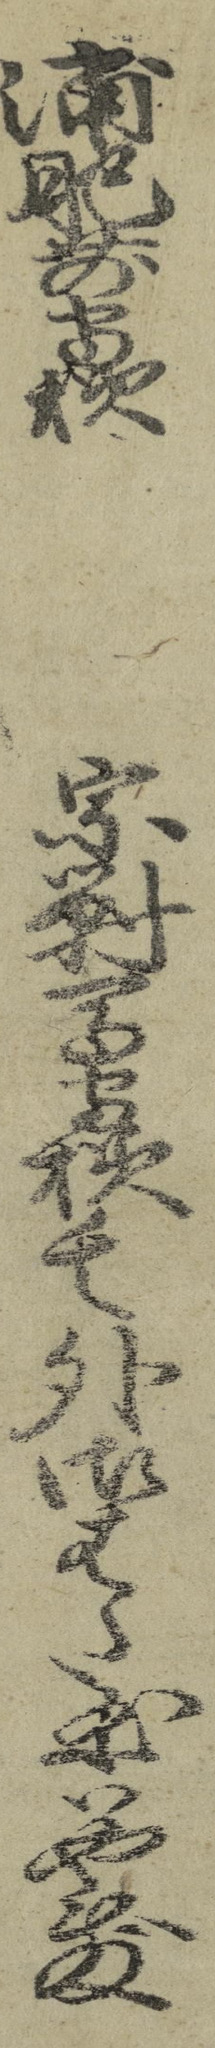浦肥前守様宗対馬守様其外御はた本御や敷
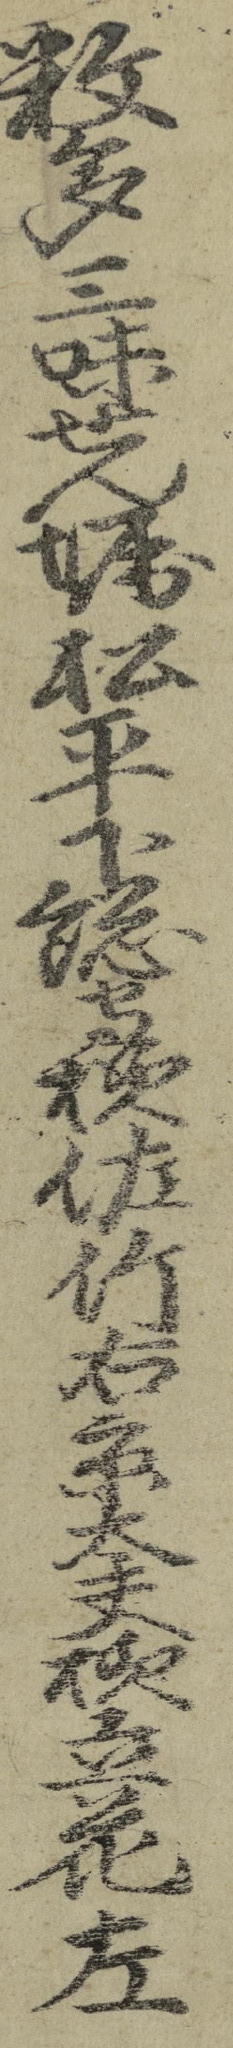数多三味せん堀松平下総守様佐竹右京太夫様立花左
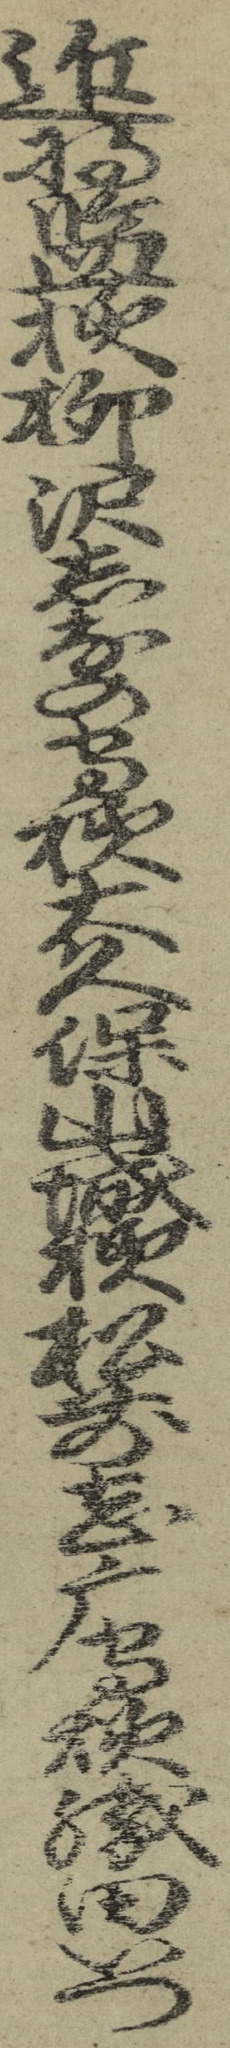近将監様柳沢しなの守様大久保山城様松前志摩守様織田いつ
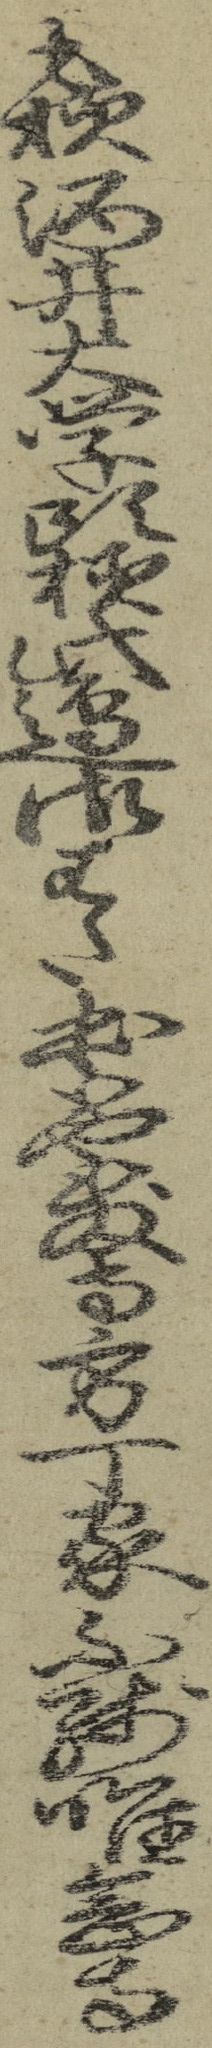も様酒井大学頭様此辺御はた本御や敷寺方丁家不残唯念寺
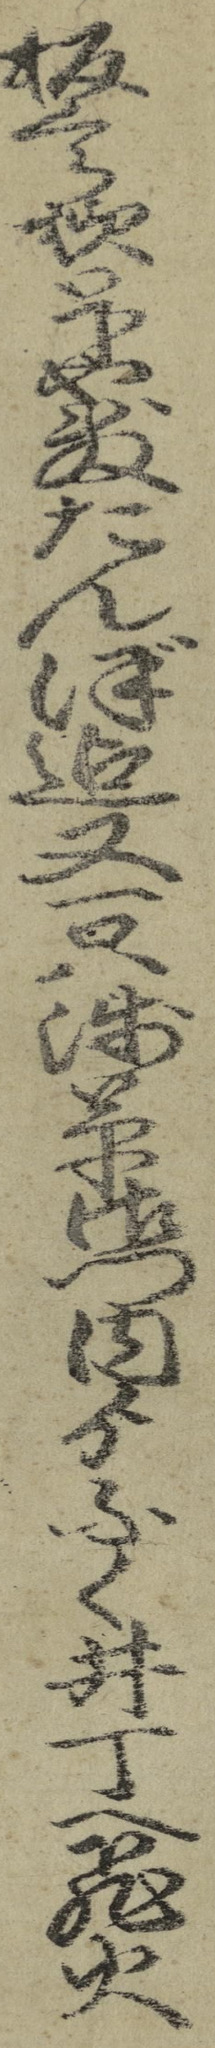板くら様御下や敷たんぼ迄又一口は浅草御門内ゟふく井丁へ飛火
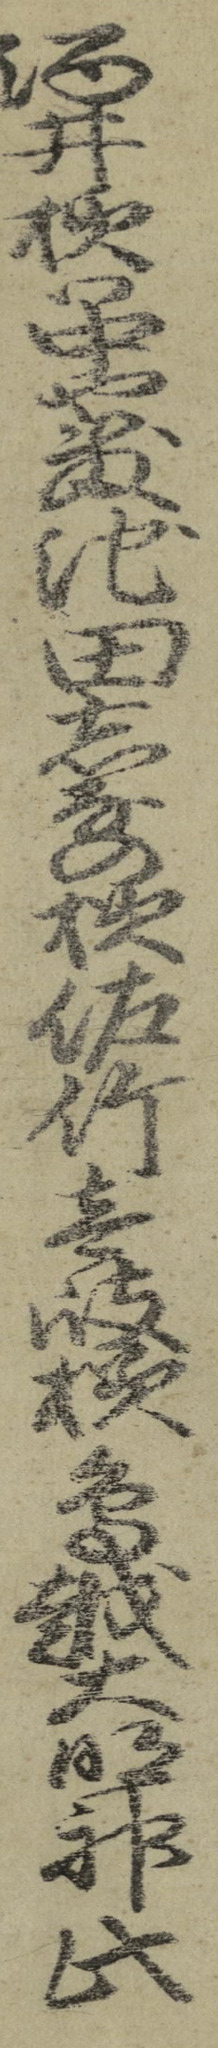酒井様御中や敷池田しなの様佐竹壱岐様鳥越大明神此
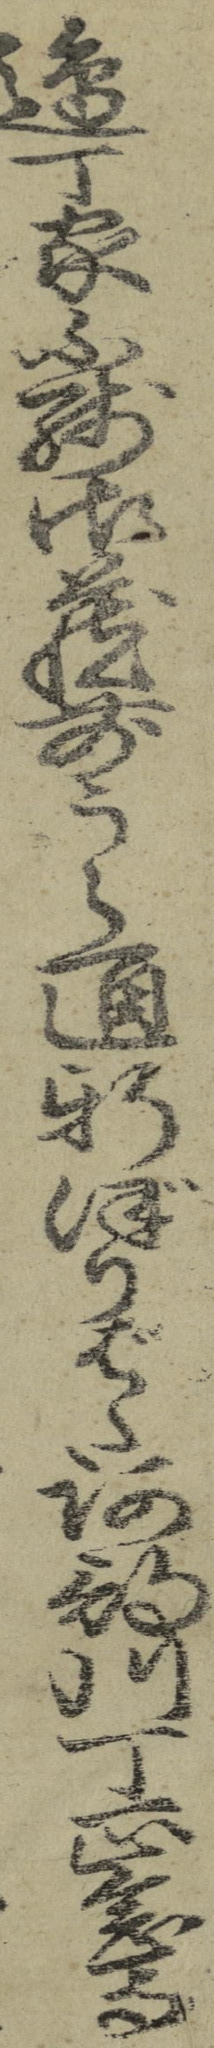辺丁家不残御蔵前うら通新ぼりばた阿部川丁正念寺
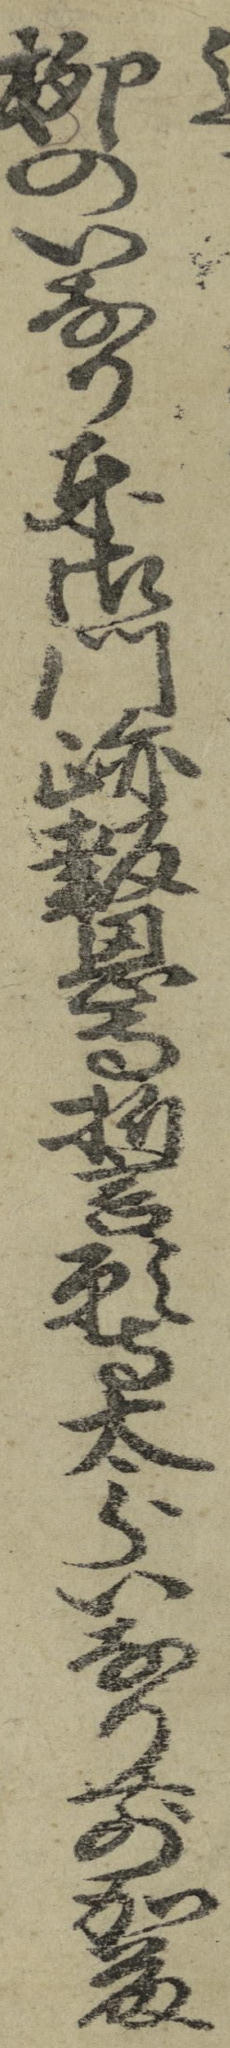柳のいなり東御門跡報恩寺誓願寺太郎いなり前加藤
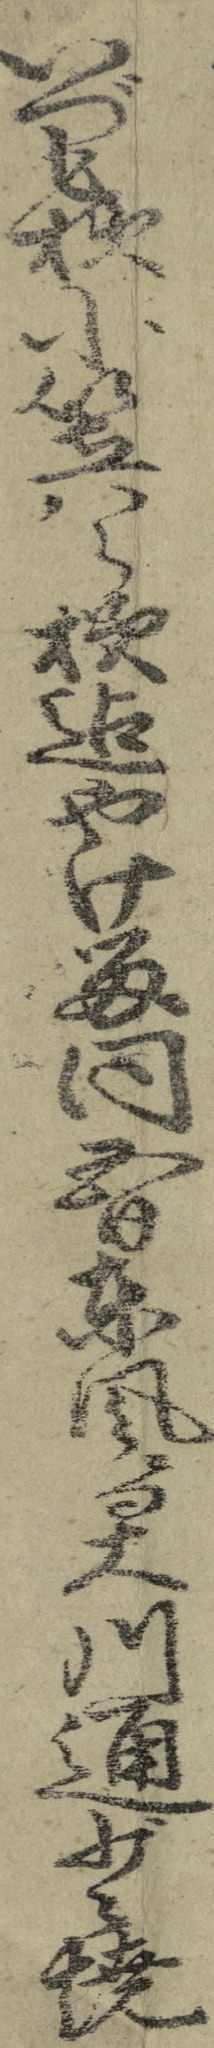いづも様小笠はら様迄やけ留同五日東風に而大川通少〻焼
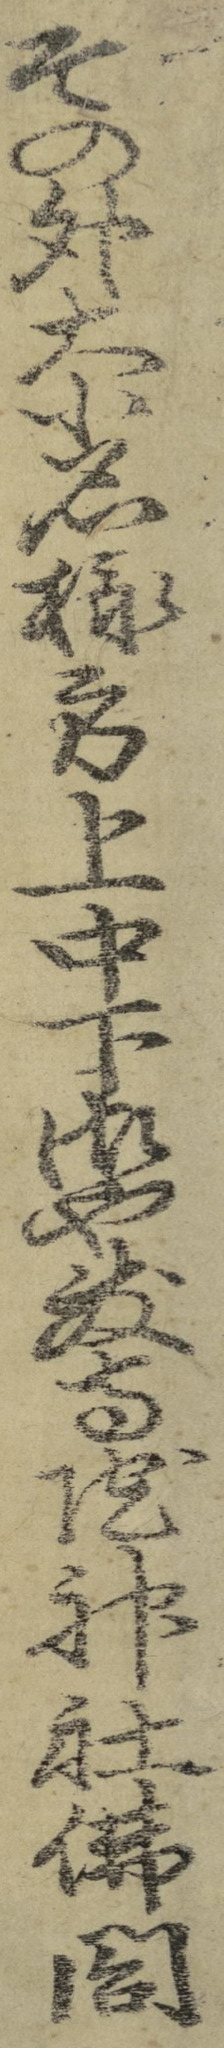その外大小名様方上中下御や敷寺院神社仏閣
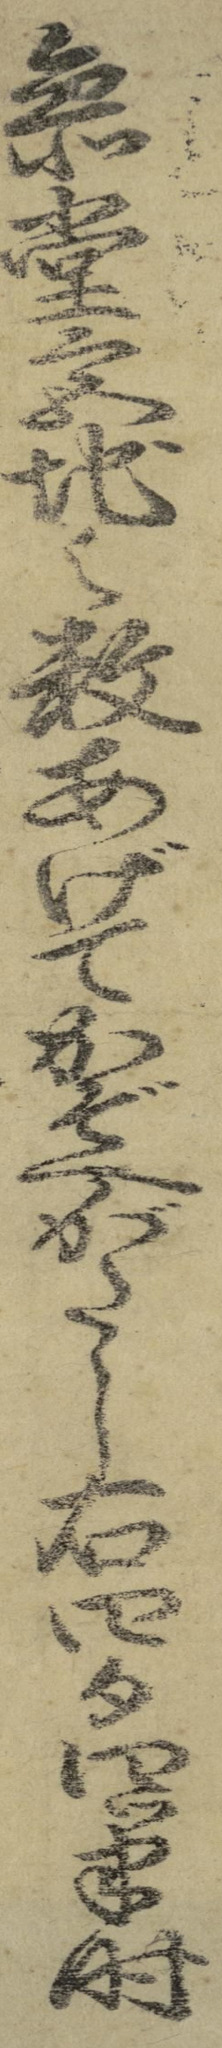分所堂宮地之数あげてかぞへがたし右四日四ツ半時
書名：出火方角場所附
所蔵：東京大学地震研究所図書室 Earthquake Research Institute Library, The University of Tokyo, JAPAN
